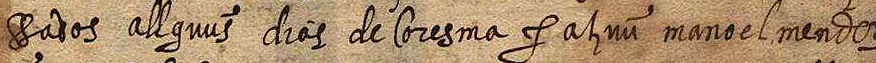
ssados allguu̅s dias de Coresma ꝑa huu̅ manoel mendez
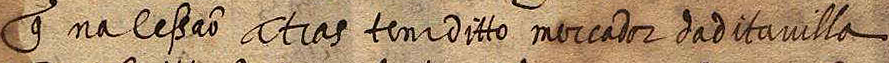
q̅ na cessão atras tem ditto mercador da dita uilla
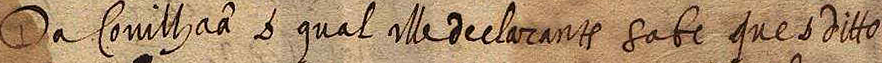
Da Couilhaã o qual elle declarante sabe que o ditto
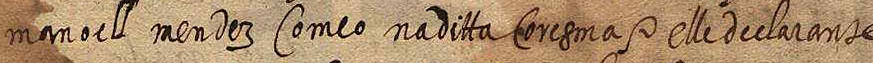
manoell mendez Comeo na ditta Coresma e elle declarante
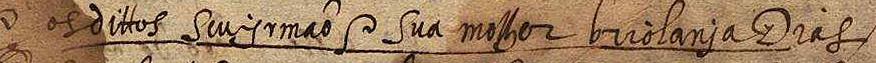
e os dittos seu yrmaõ e sua molher briolanja Dias /
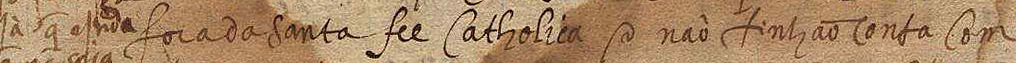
fora da Santa fee Catholica e não tinhaõ conta Com
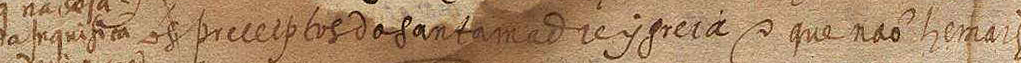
os preceiptos da santa madre ygreia e que naõ he mais
